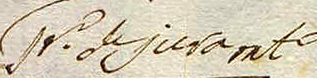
Tr.o de juramto
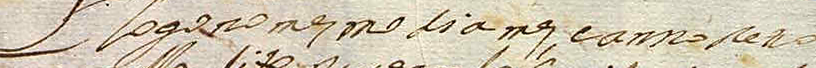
E logo no mesmo dia mes e anno retro
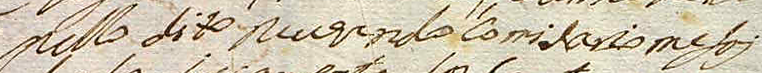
pello dito Reuerendo comisario me foj
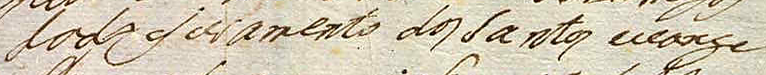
dado juramento dos Santos euange
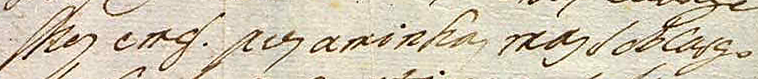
lhos em q̄ pos a minha mas sob cargo
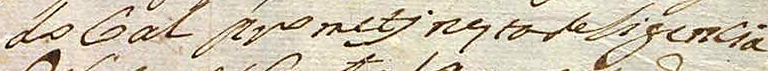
do coal prometj nesta deligencia
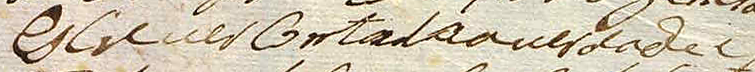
escreuer con toda a uerdade e
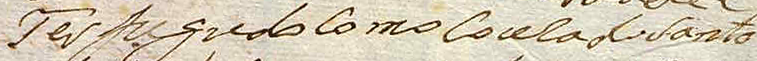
Ter segredo como couza do santo
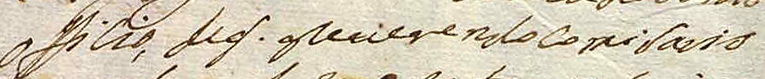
officio, de q̄. reuerendo comisario
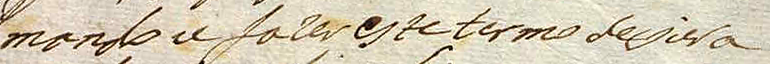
mandou fazer este termo de jura
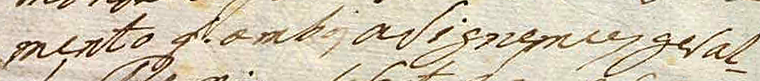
mento q̄. ambos asignemos geral
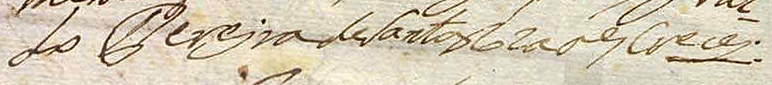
do Perejra de Santa Roza o esCreuj
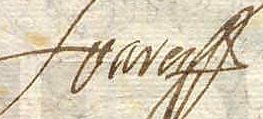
Soares
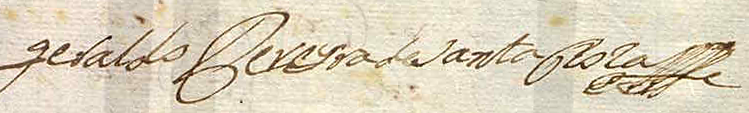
geraldo Pereyra de santa Roza
